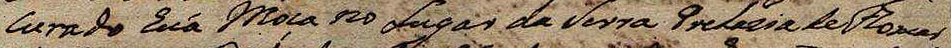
curado huā moça no Lugar da serra Prelazia de Thomar,
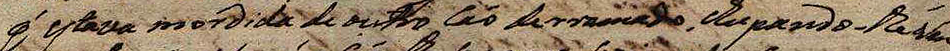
q̄ estava mordida de outro caõ derramado, chupando-lhe san
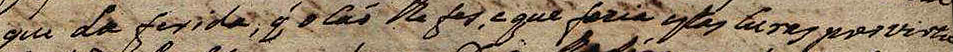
gue da ferida, q̄ o caõ lhe fes, e que fazia estas curas por virtu
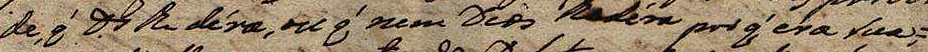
de, q̄ D.s lhe déra, ou q̄ nem Deos lhe déra porq̄ era sua
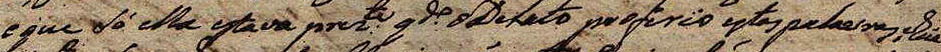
e que só ella estava prez.te qdo. o Delato proferio estas palavras, e huā
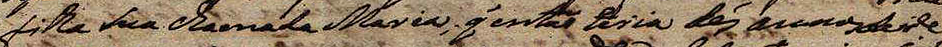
filha sua chamada Maria, q̄ então teria dés annos de id.e
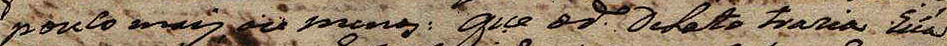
pouco mais ou menos: que o d.o Delato trazia huā
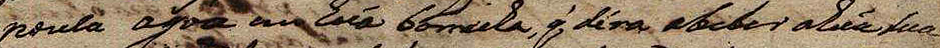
pouca agoa em huā Comcha, q̄ déra a beber a huā sua
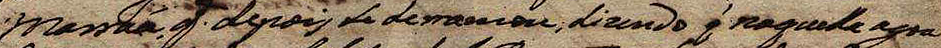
mamá q̄ depois se derramou, dizendo q̄ naquella agoa
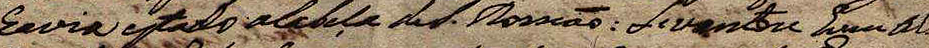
havia estado a Cabeça de S. Romaõ: Levantou hum al
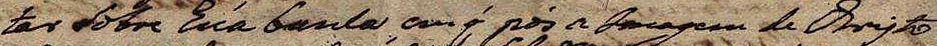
tar sobre huā banca, em q̄ pós a Imagem de Christo
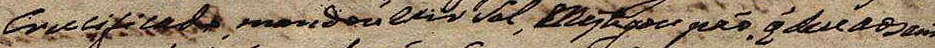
crucificado, mandou vir sal, Mastigou paõ q̄ deu aos ani
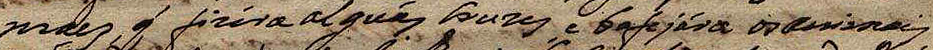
maez, q̄ fizéra alguās cruzes e bosejára os animais
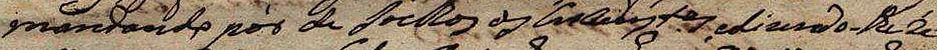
mandando pór de Joelhos os circunst.es, e dizendo-lhe Re
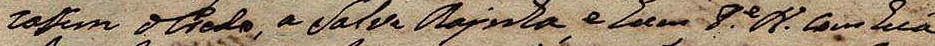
zassem o Credo, a salve Raynha, e hum P.e N. com huā
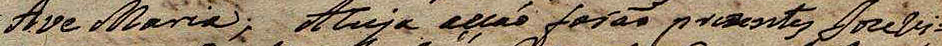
Ave Maria; A cuja aççaõ forão prezentes Joze vi
